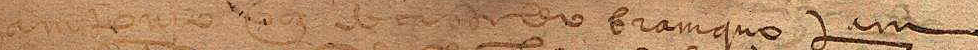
amtonjo vāz de castello bramquo tam
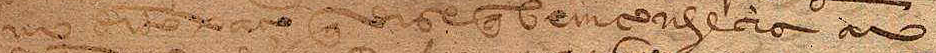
no dito paço q̄ dise q̄ bem conheçia ao
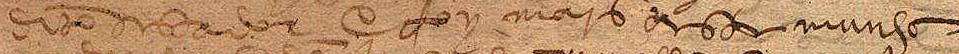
dito testador e foy majs testemunha
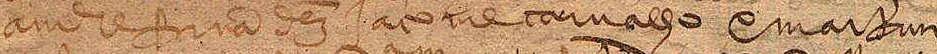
amdre fernādez Jacome carualho e martim
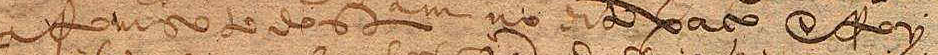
afomso todos tam no dito paço e foy
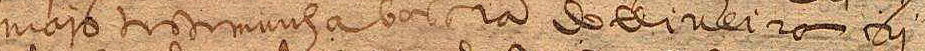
majs testemunha bastiā dolliueira crj
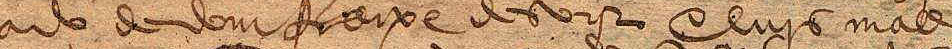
ado de dom fellipe de sorja e lujs mall
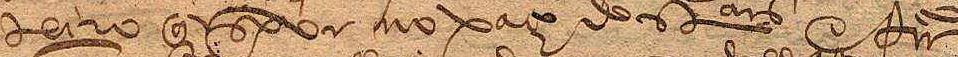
teiro q̄ esp̄ve no paço dos taes e frrco
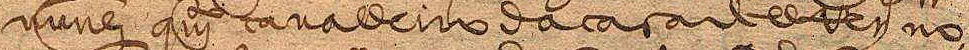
nunez qujto caualleiro da casa dell Rey no
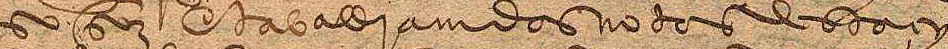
so s̄or e taballjam das notas desta çy
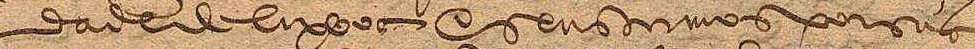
dade de lixboa e seus termos por sua
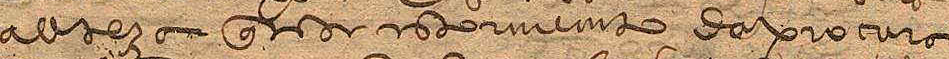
allteza q̄ este estormemto da procura
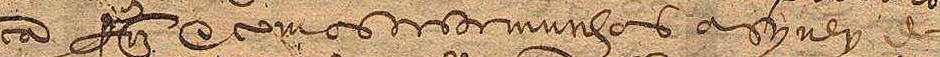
cā fiz e com as testemunhas asyney de
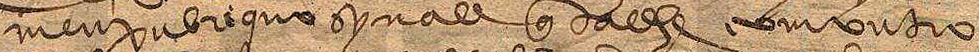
meu pubriquo synall q̄ tall he com outro
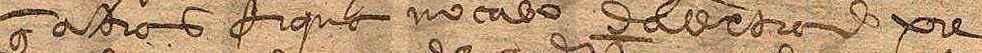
q̄ atras fiqua no cabo da lletra do pre
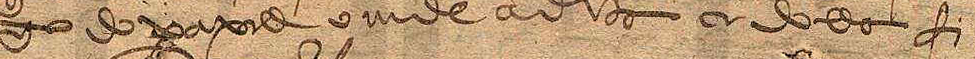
go do papell omde a dita cedolla fi
